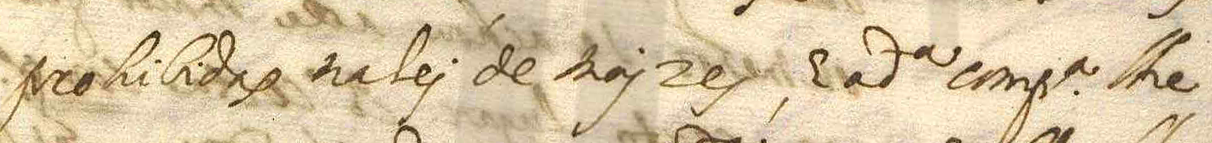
prohibidas na lej de mojzes, E a d̄a comp.a. lhe
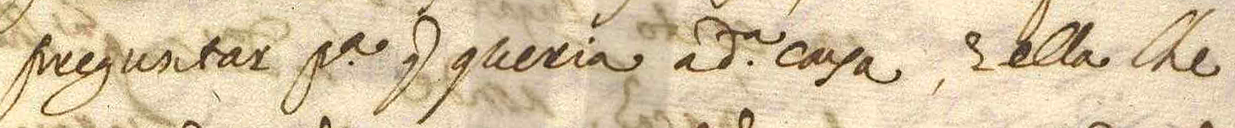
preguntar p.a q̄ queria a d̄.a cousa, E ella lhe
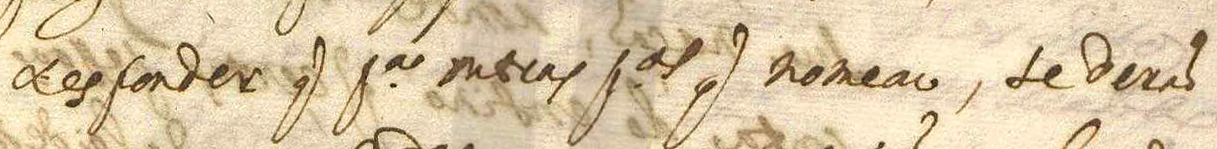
responder q̄ p.a outras p.as q̄ nomeou, se deraõ
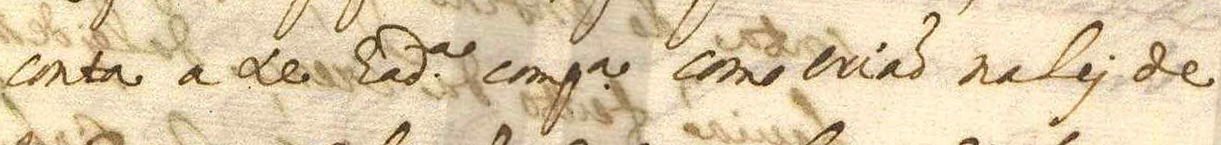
conta a re E a d̄.a compa. como criaõ na Lej de
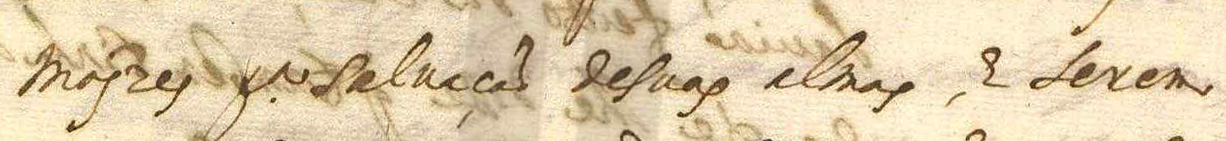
mojzes p.a saluaçaõ de suas almas, E serem
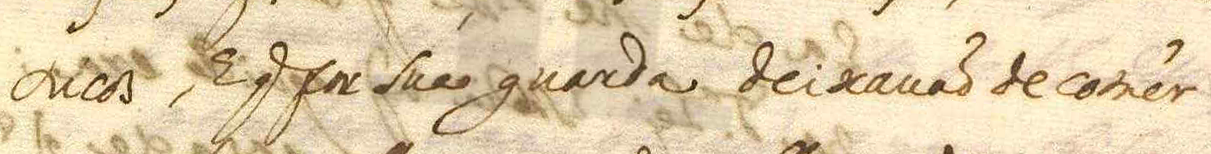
ricos, E q̄ por sua guarda deixauaõ de comēr
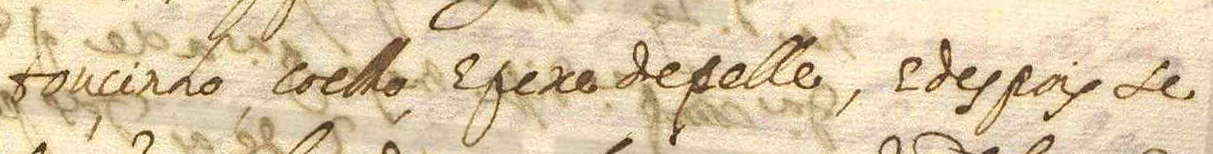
toucinho, coelho, e pexe de pelle, e despois se
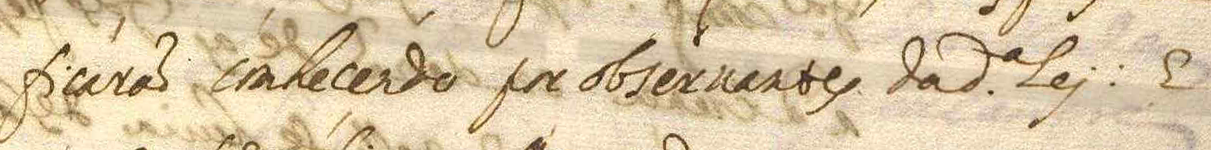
ficaraõ conhecendo por obseruantes da d̄a lej: E
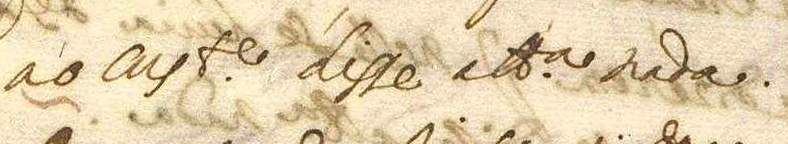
ao cust.e disse a tt.a nada.
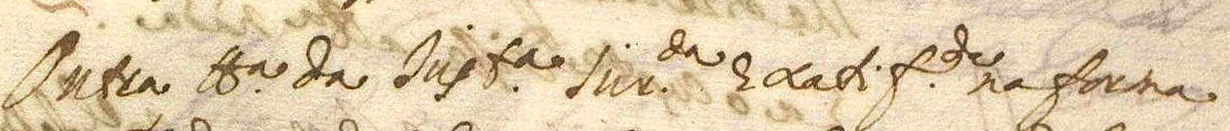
Outra tt.a da Iust.a Iur.da E ratif.da na forma
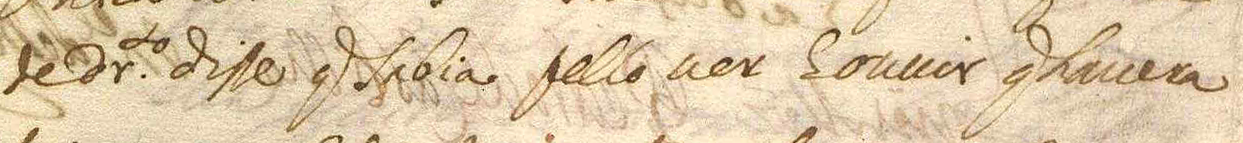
de dr.to disse q̄ sabia pello uer E ouuir q̄ hauera
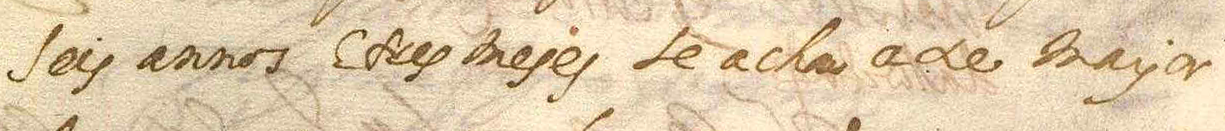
seis annos E tres meses se acha a re mayor
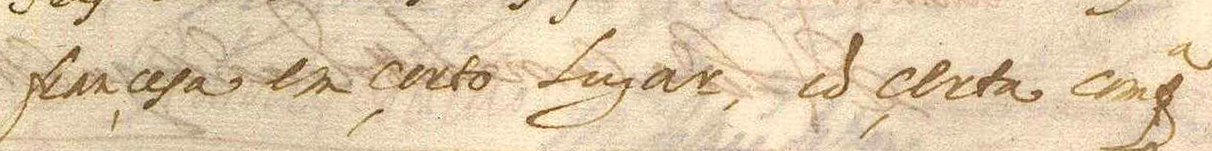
francesa em certo lugar, cō certa compa
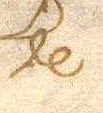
de
